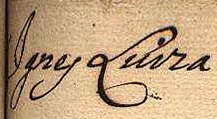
Jgnes Luiza
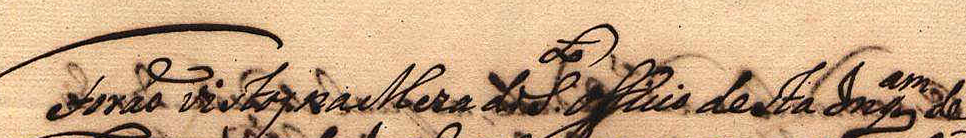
Foraõ vistos na Meza do S.to officio desta Inq.am de
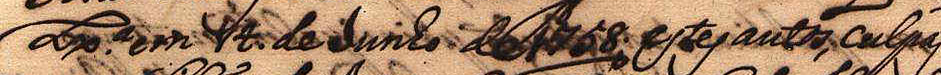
Lx.a em 14. de Iunho de 1758: estes autos, culpas
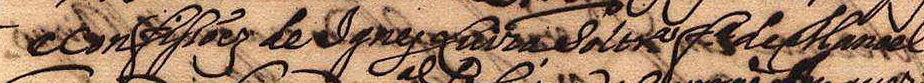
e confissõez de Ignes Luiza, Soltra f.a de Manoel
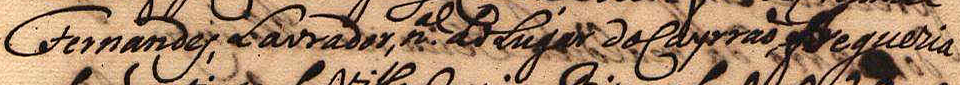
Fernandes, Lavrador n.al do Lugar do Cayrraõ, freguezia
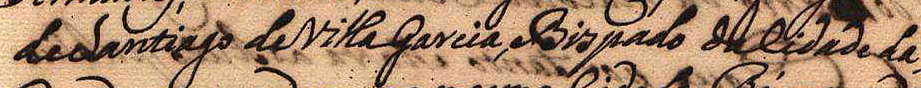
de Santiago de Villa Garcia, Bispado da Cidade da
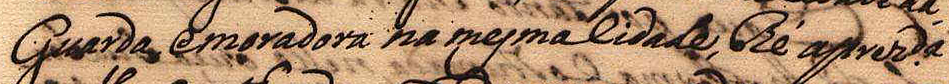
Guarda, e moradora na mesma Cidade, Ré aprez.da
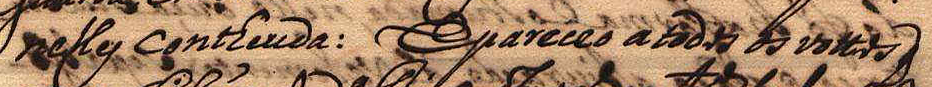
nelles contheuda: E pareceo a todos os vottos q̄
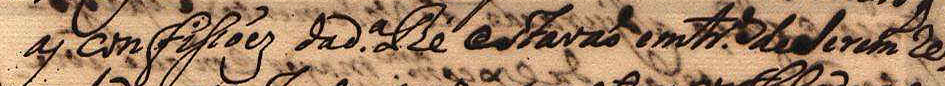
as confissõez da d.a Ré estavaõ em tr.o de serem Re
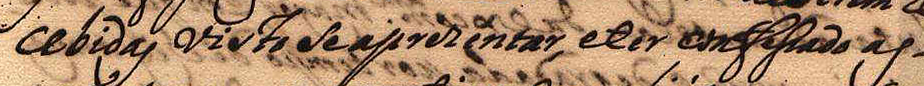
cebidas visto se aprezentar, e ter confessado as
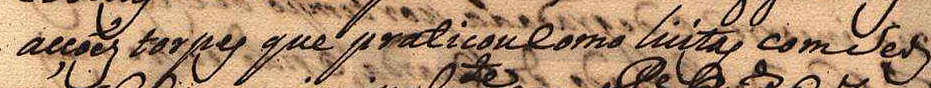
acçõez torpes que praticou como licitas com seos
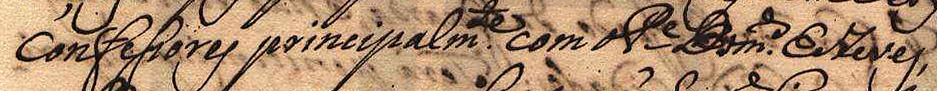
confessores principalm.te com o P.e Dom.es Esteves,
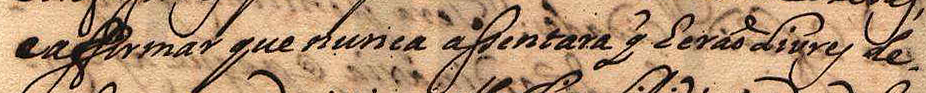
e affirmar que nunca assentara q̄ heraõ Livres de
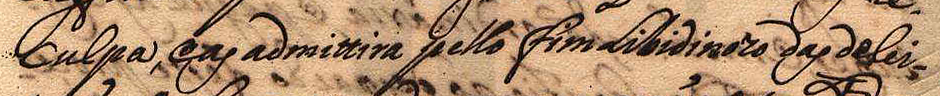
Culpa, e as admittira pello fim Libidinozo das delei
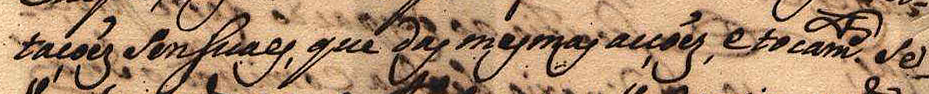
taçoẽz sensuaes, que das mesmas acçoẽz, e tocam.tos se
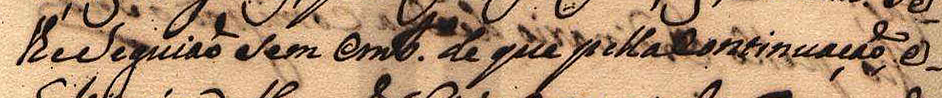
lhe seguiaõ sem emb.o de que pella continuaçaõ, e
